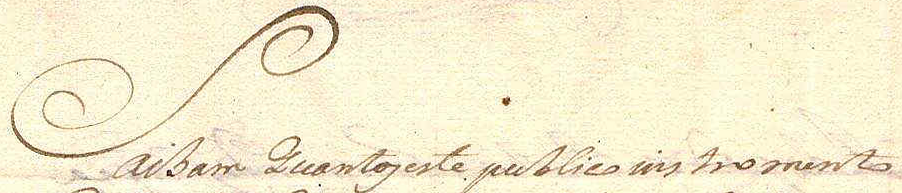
Saibam Quantos este publico instromento
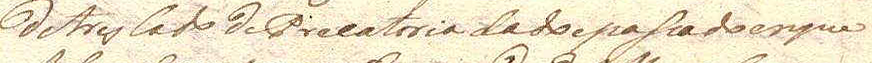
de treslado de Precatoria dado e passado en pu
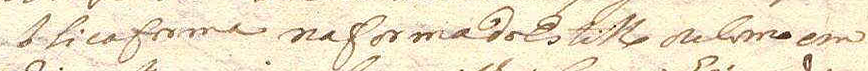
blica forma na forma do Estillo ou Como em
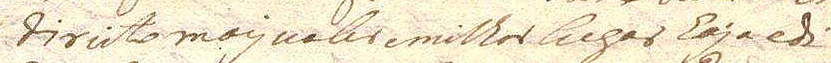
direito mais ualer e milhor lugar haja e di
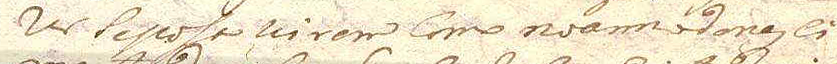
zer se possa uirem como no anno do nasci
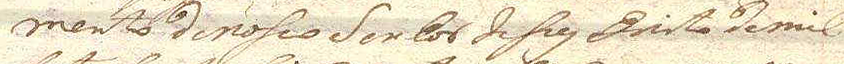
mento de nosso Senhor Iesus christo de mil
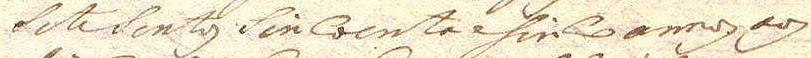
setesentos sincoenta e sinco annos aos
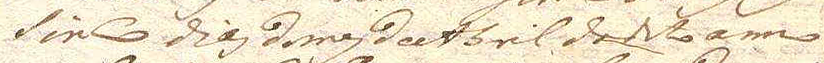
sinCo dias do mes de Abril do dito anno
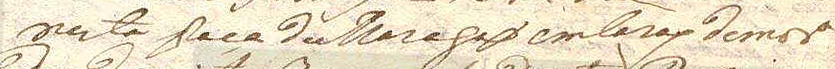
nesta pRaça de Mazagaõ em Cazas de mora
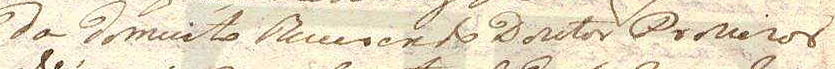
da do muito Reuerendo Doutor Prouizor
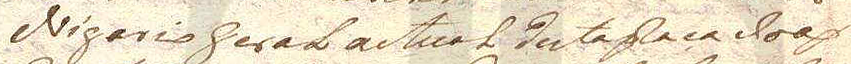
e Vigario GeraL actual desta pRaça Ioaõ
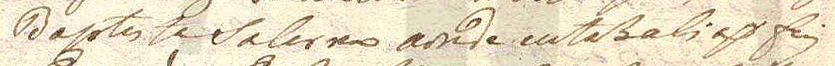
Baptista Salerno aonde eu tabaliaõ fuy
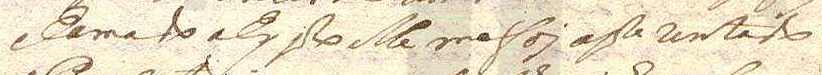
chamado ahy pRo elle me foj apRezentado
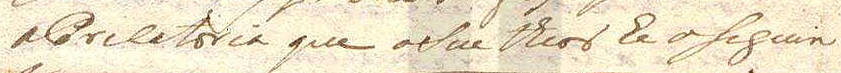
a Precatoria que o seu theor he o seguin
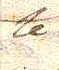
te
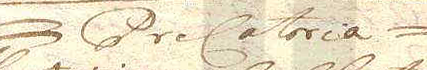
= PreCatoria =
